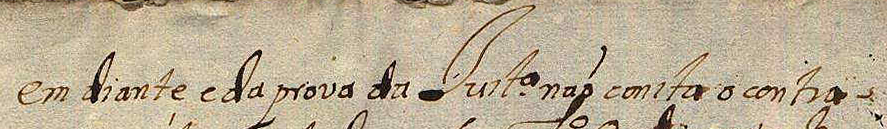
em diante e da prova da Iust.a naõ consta o contra
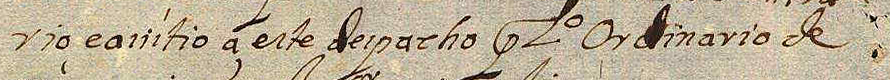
rio e asistio a este despacho p̄Lo Ordinario de
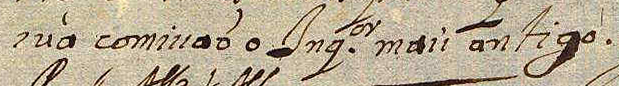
sua comissaõ o Inq.or mais antigo.
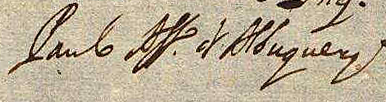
Paulo Aff.o d̄ Albuquerq̄
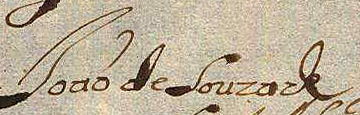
Ioaõ de Souza de
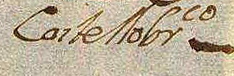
Castello br.co
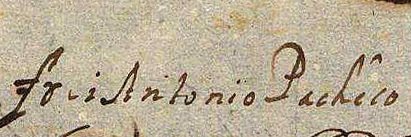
frei Antonio Pachêco
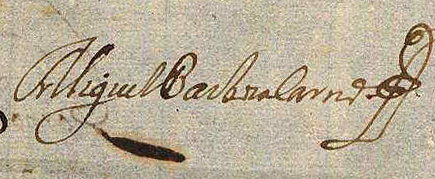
Miguel Barboza Carnro
